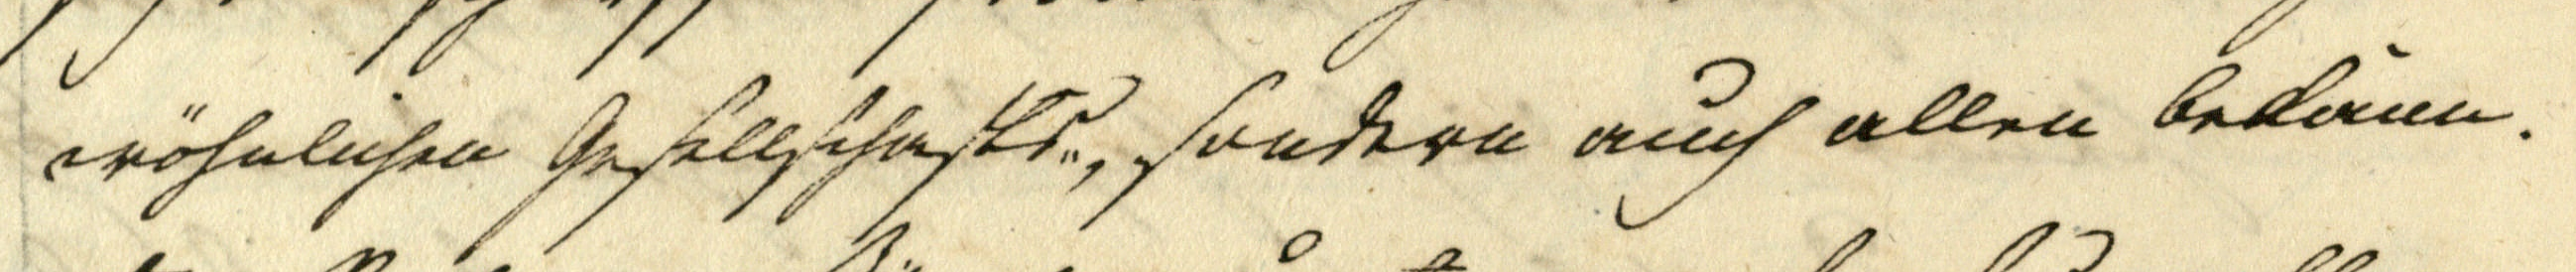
wöhnlihen Gesellschafts-, sondern auch allen bekann¬
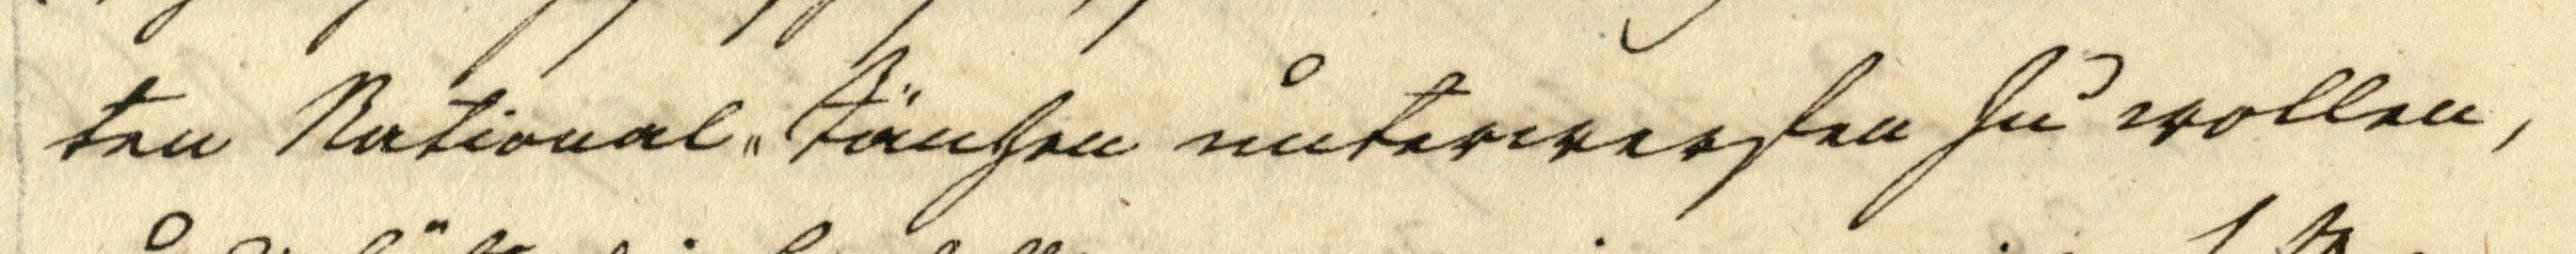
ten National- Tänzen unterwerfen zu wollen,
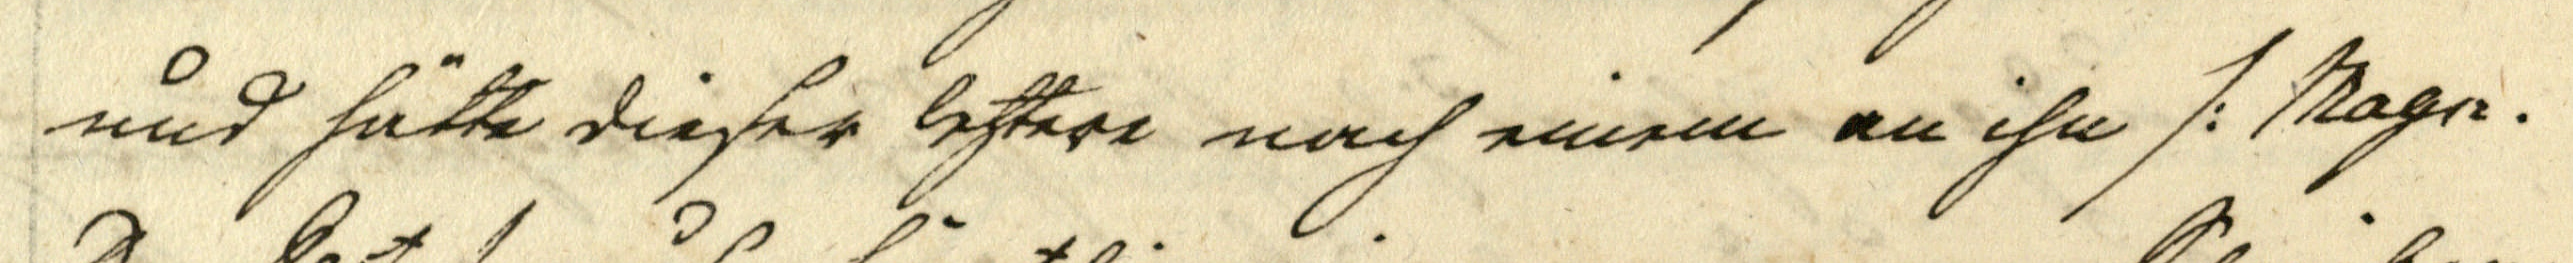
und hätte dieser letztere nach einem an ihn /: Magn.
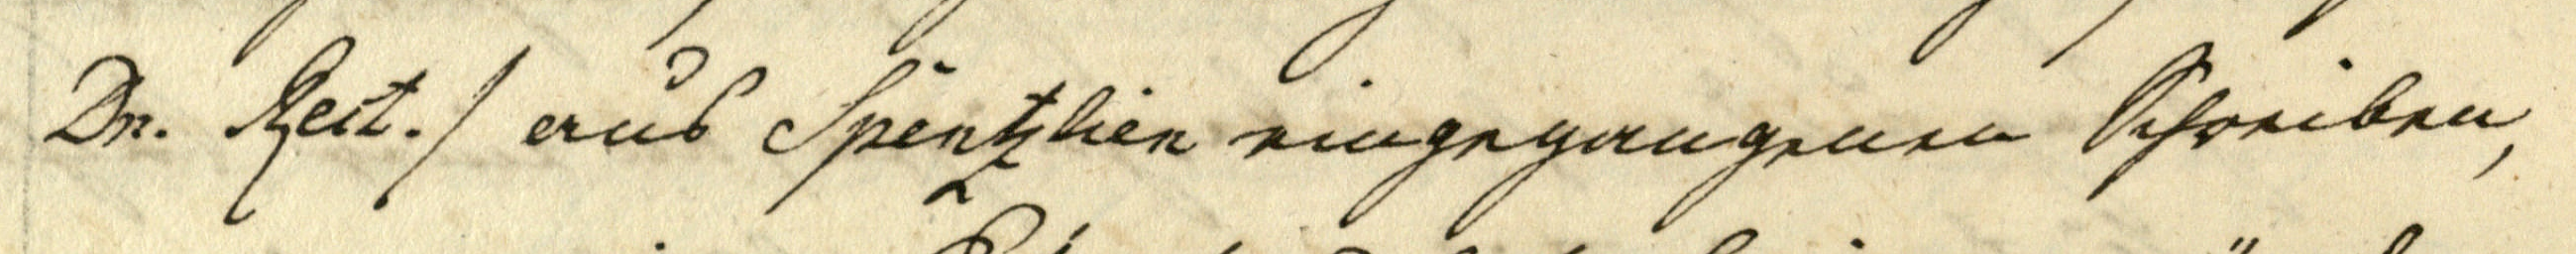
Dn. Recht. / aus Spentzlien eingegangenen Schreiben,
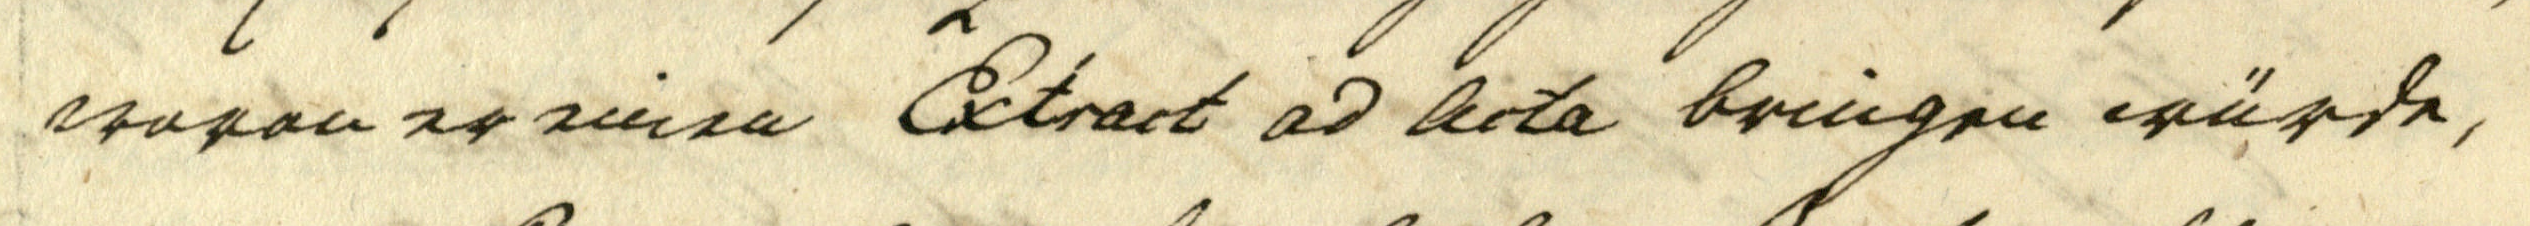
wovon er einen Extract ad Acta bringen würde,
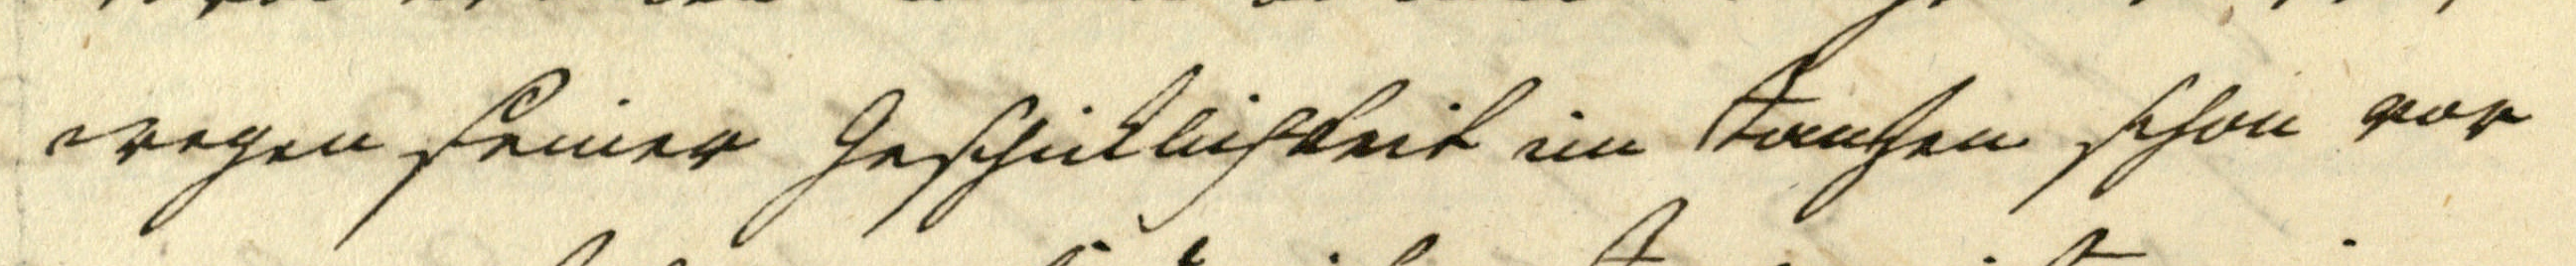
wegen seiner Geschicklichkeit im Tanzen schon vor
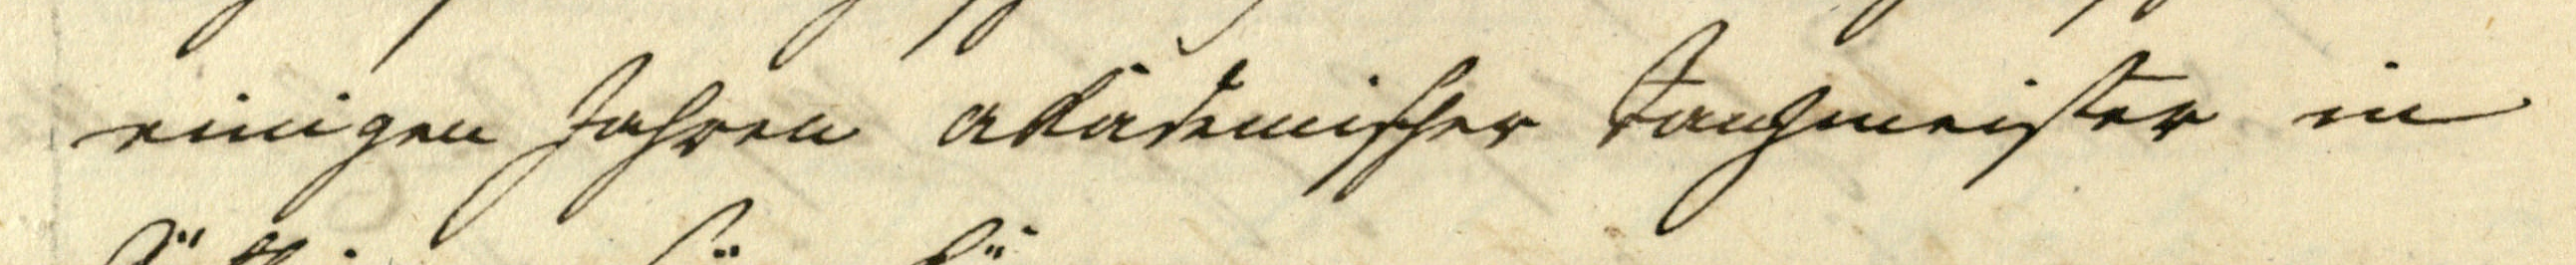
einigen Jahren akademischer Tanzmeister in
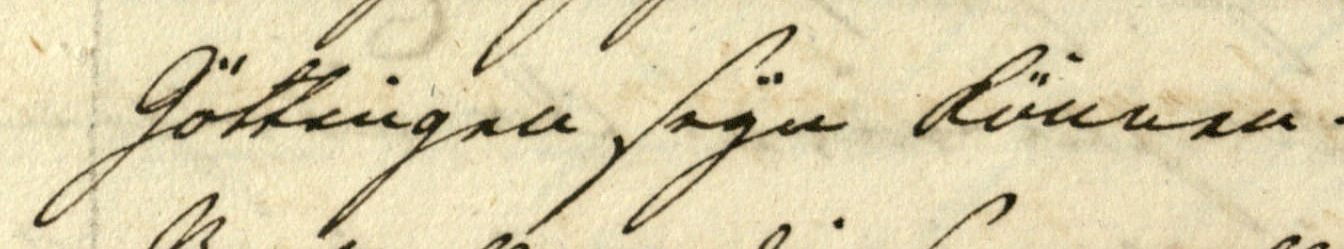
Göttingen seÿn können.
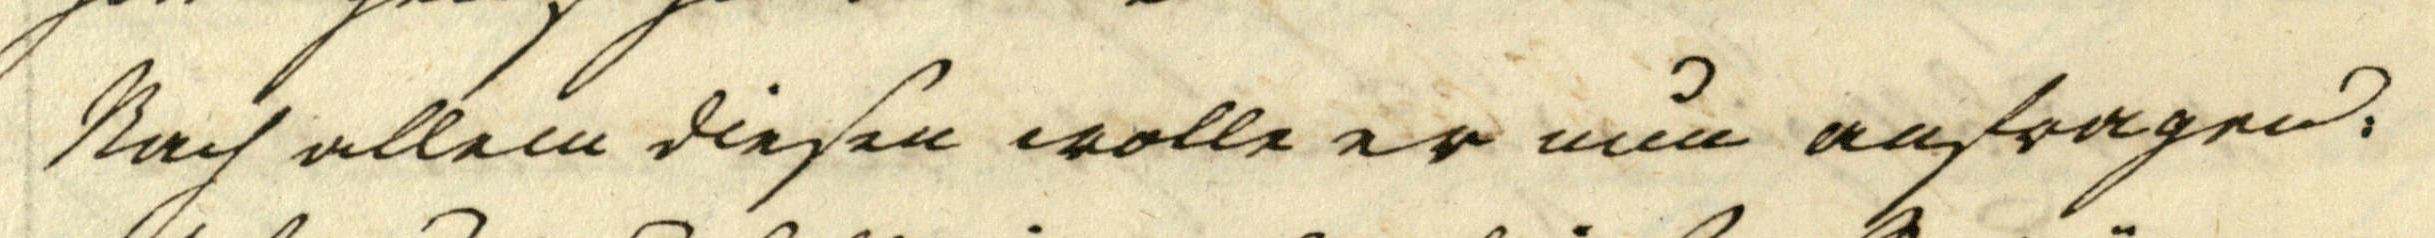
Nach allem diesen wolle er nun anfragen:
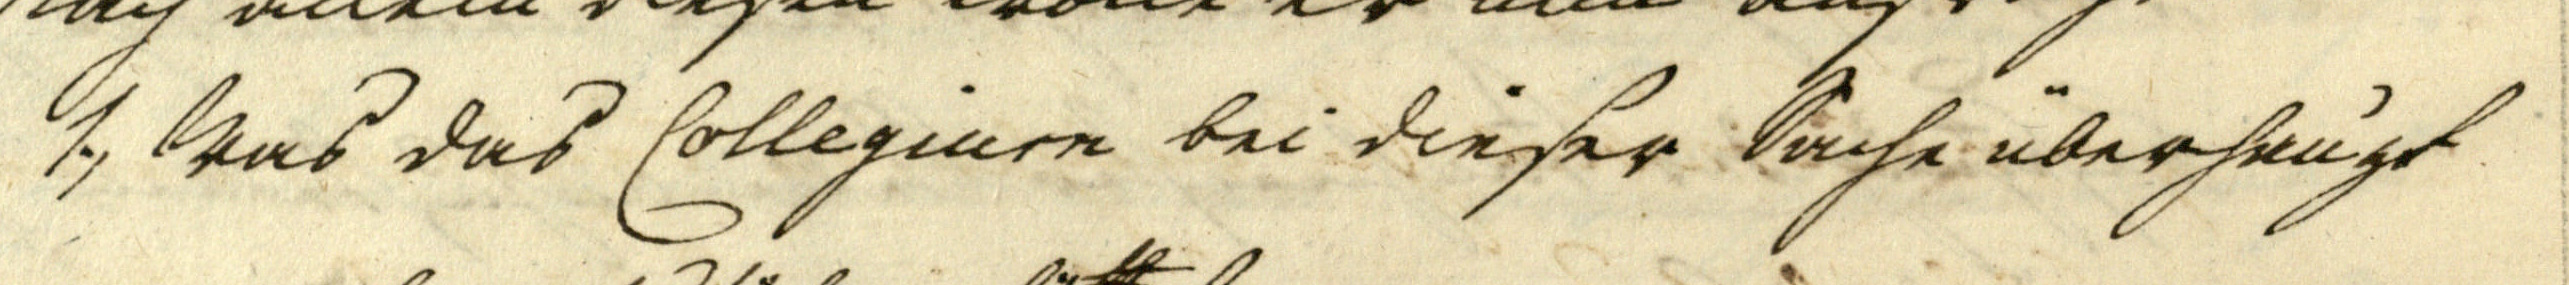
1., Was das Collegium bei dieser Sache überhaupt
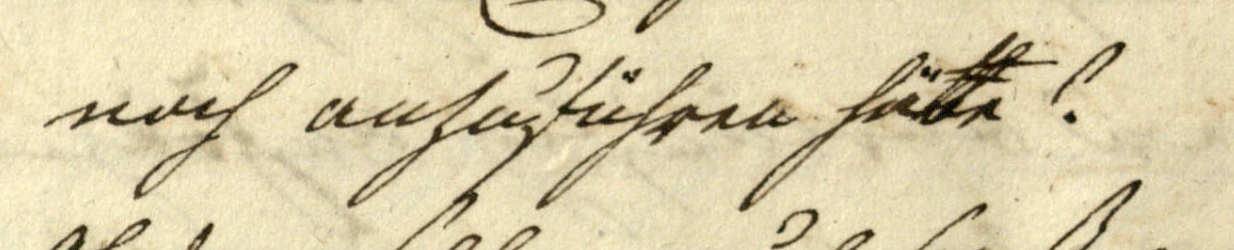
noch anzuführen hätte?
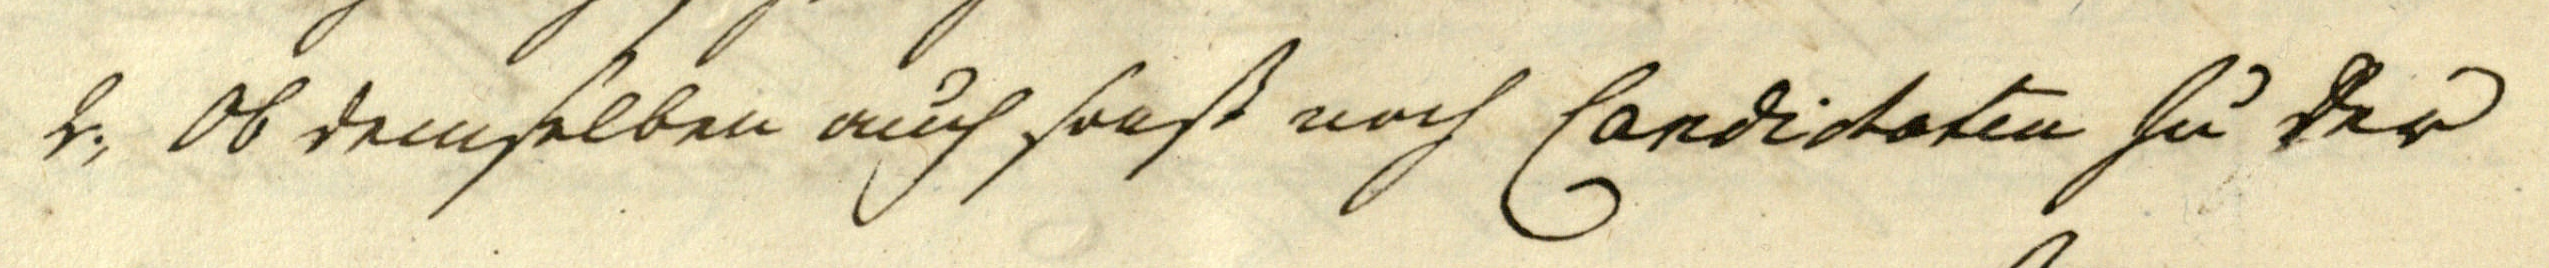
2., Ob demselben auch sonst noch Candidaten zu der
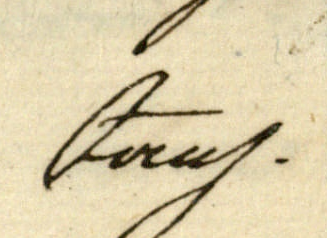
Tanz.
